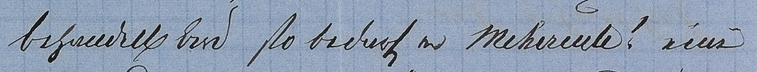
behandelt wird so bedarf es Mehercule! eine
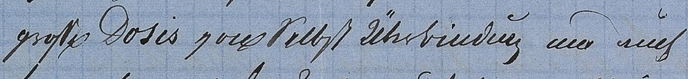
große Dosis von Selbst Überwindung um auch
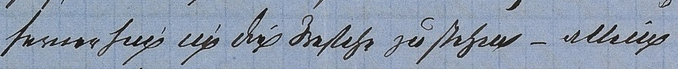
ferner hin in die Bresche zu stehen – allein
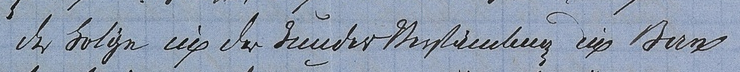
der Folge in der Bundes Versamlung in Bern
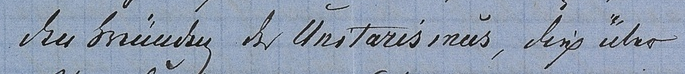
den Freunden des Unitarismus, die über
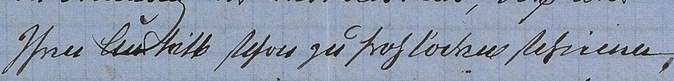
Ihren Austritte schon zu frohlocken scheinen,
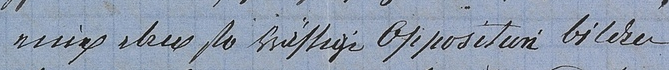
eine eben so kräftige Opposition bilden
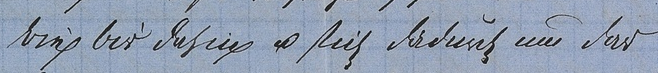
wie bis dahin & sich dadurch um das
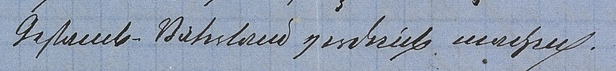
Gesamt-Vaterland verdient machen.
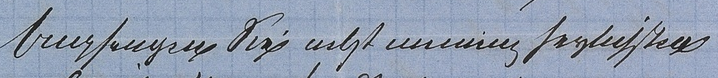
Empfangen Sie nebst meinem herzlichsten
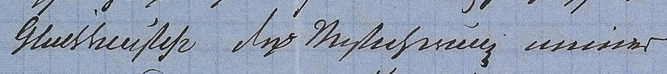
Glückwnsche die Versicherung meiner
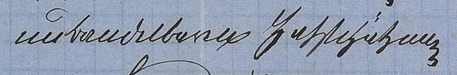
unwandelbaren Hochschätzung
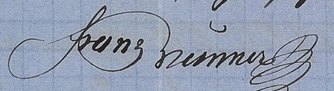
Franz Brunner
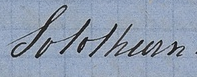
Solothurn
